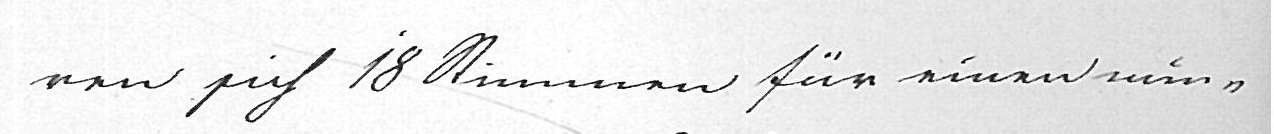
ren sich 18 Stimmen für einen min-
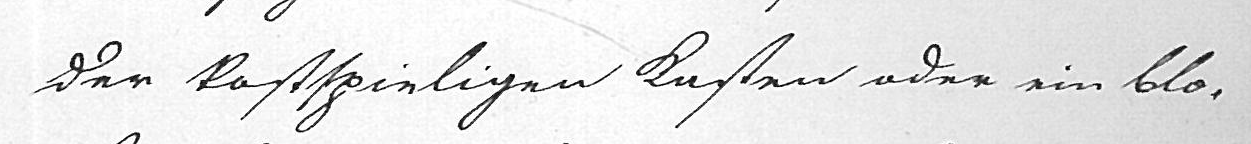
der köstspieligen Kasten oder ein blo-
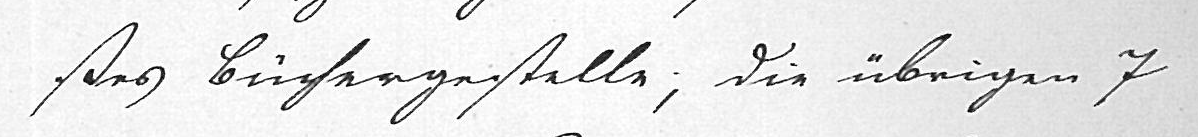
ßes Büchergestelle; die übrigen 7
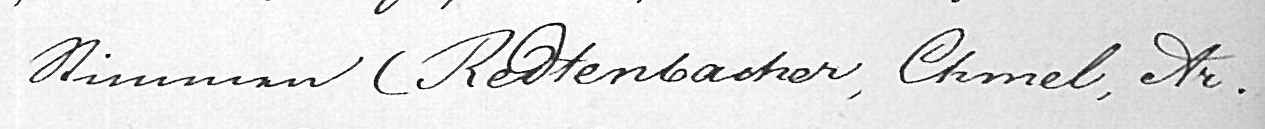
Stimmen (Redtenbacher, Chmel, Ar-
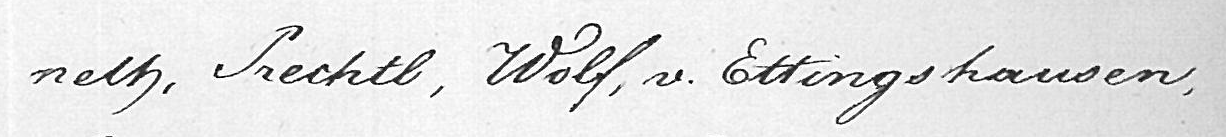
neth, Prechtl, Wolf, v. Ettingshausen,
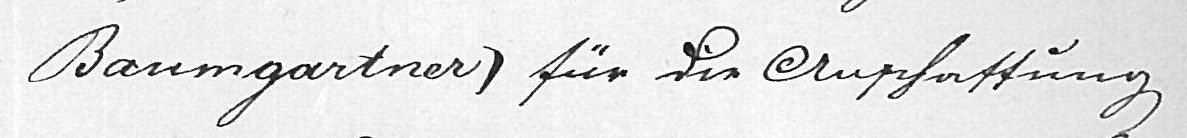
Baumgartner) für die Anschaffung
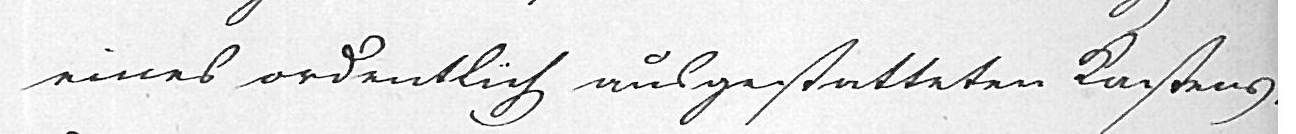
eines ordentlich ausgestatteten Kastens
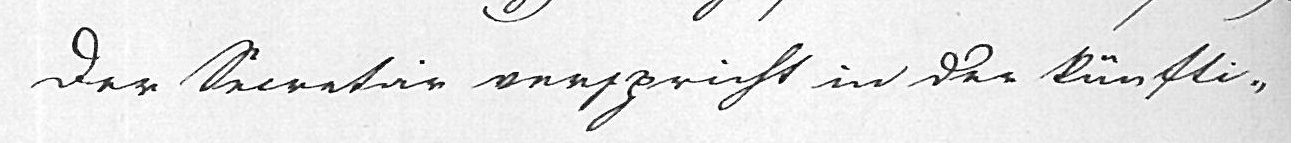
Der Secretär verspricht in der künfti-
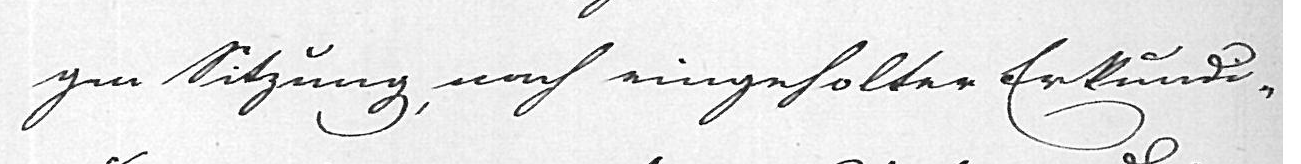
gen Sitzung, nach eingeholter Erkundi-
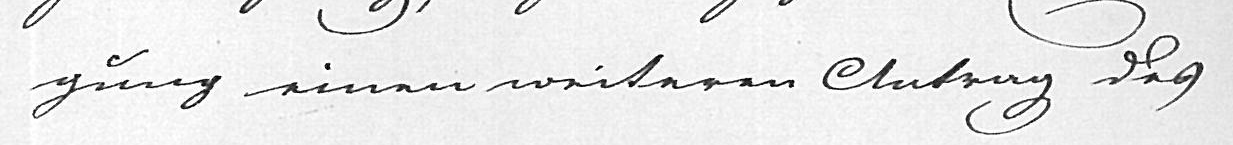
gung einen weiteren Antrag des
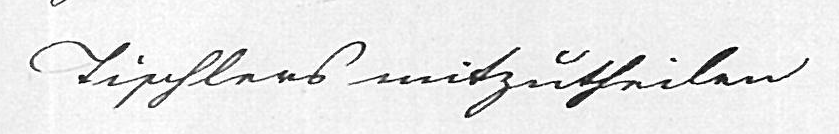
Tischlers mitzutheilen.
